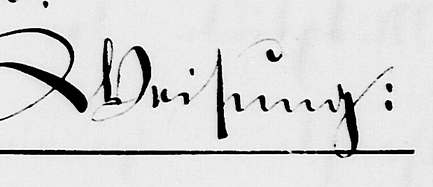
Weisung:
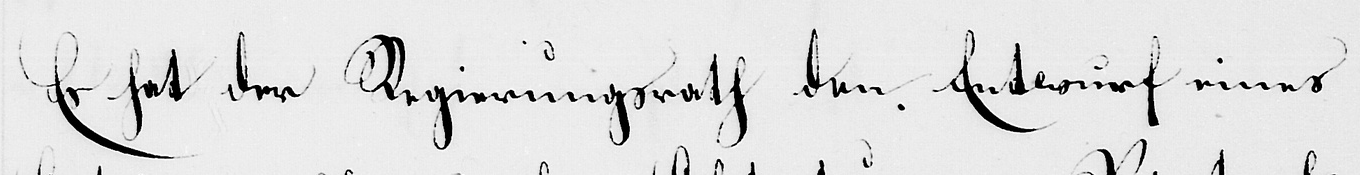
Es hat der Regierungsrath den Entwurf eines
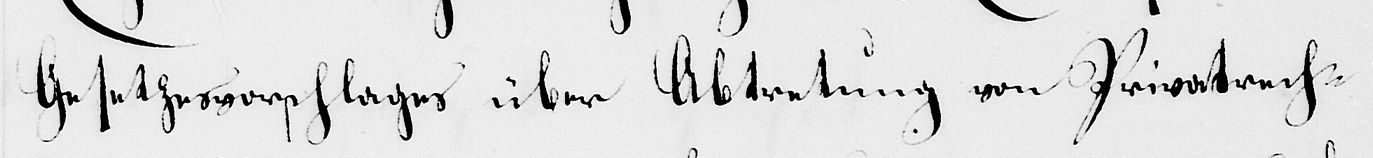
Gesetzesvorschlages über Abtretung von Privatrech¬
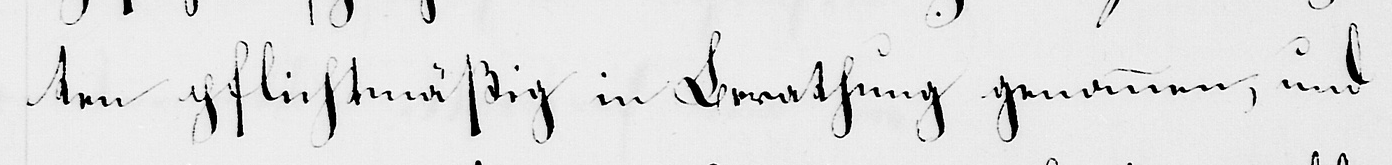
ten pflichtmäßig in Berathung genommen, und
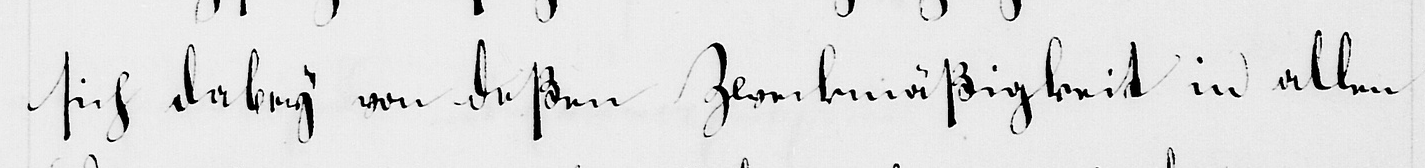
sich dabey von deßen Zweckmäßigkeit in allen
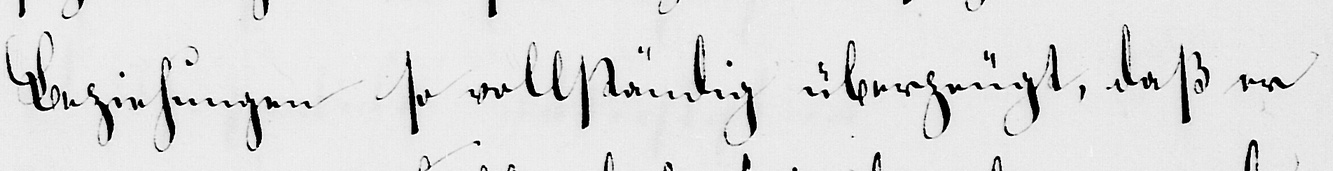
Beziehungen so vollständig überzeugt, daß er
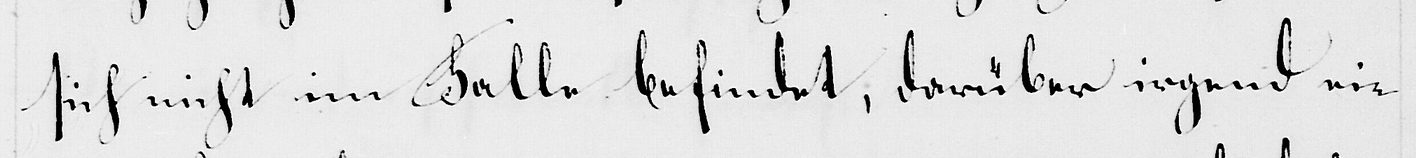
sich nicht im Falle befindet, darüber irgend ei¬
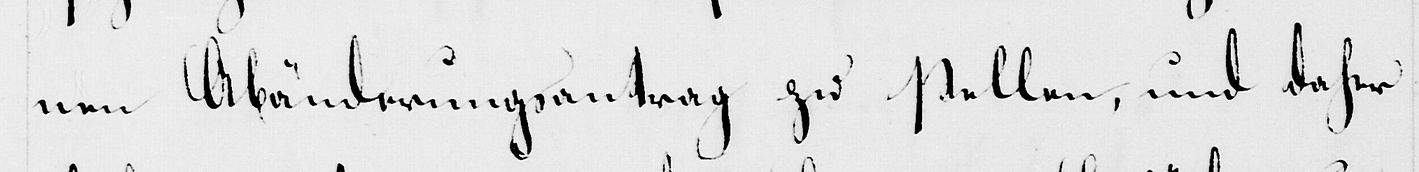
nen Abänderungsantrag zu stellen, und daher
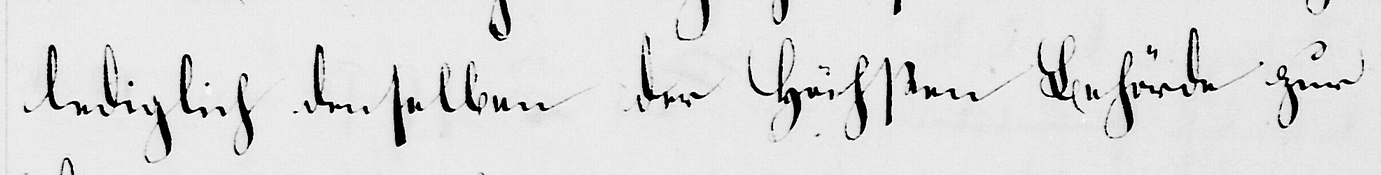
lediglich denselben der Höchsten Behörde zur
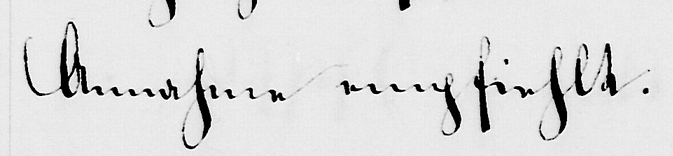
Annahme empfiehlt.
